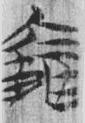○（聞）
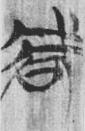唬（乎）
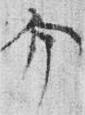大（太）
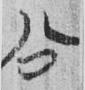公
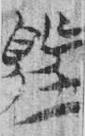○（望）
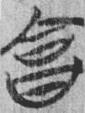○（答）
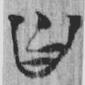曰
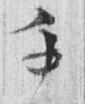身
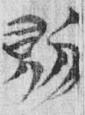則
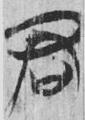君
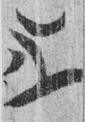之
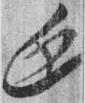臣
